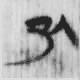孑
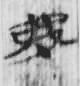弗
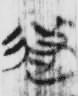﨤（及）
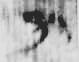孑
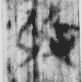收
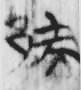邞
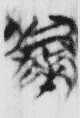○（拳）
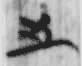之
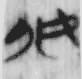○（孥）
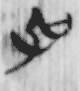加
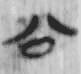公
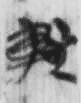○（範）
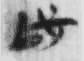戌
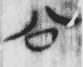公
